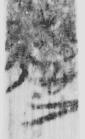{辶惪}
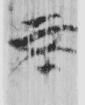不
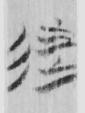{辶之}
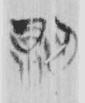則
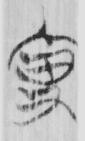{宀卑}
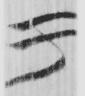于
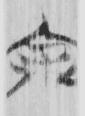余
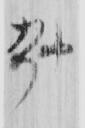引
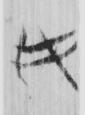女
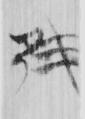隹
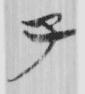子
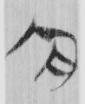今
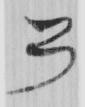乃
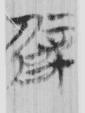辟
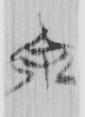余
